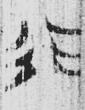行
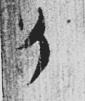人
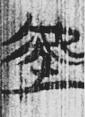○（吾）
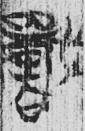○（戰）
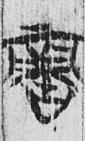啻（敵）
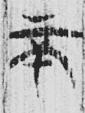不
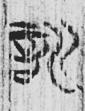訓（順）
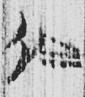於
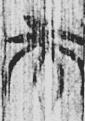天
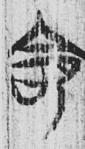命
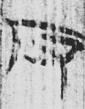反（返）
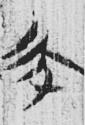帀（師）
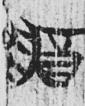𨟻（將）
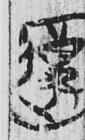○（復）
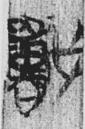戰
